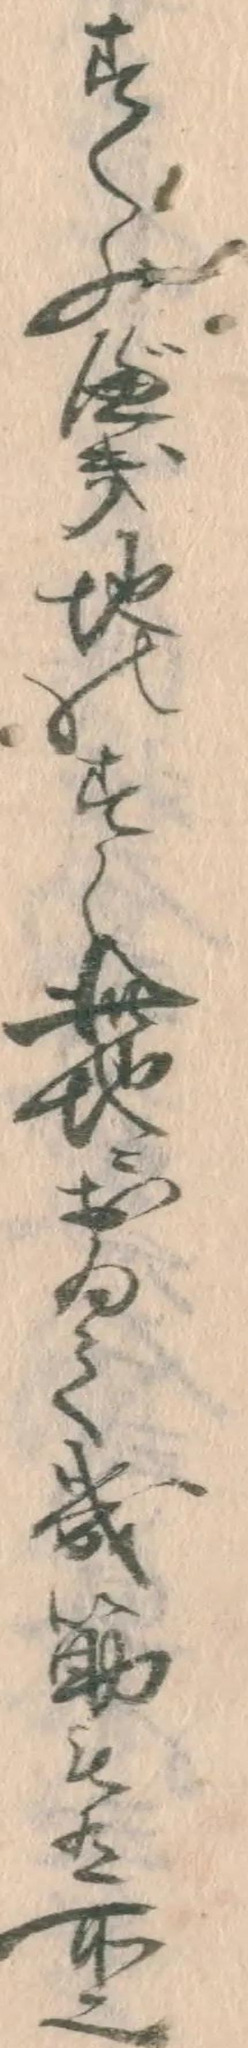すくふべき地のすし此地におゐて幾筋も有所也
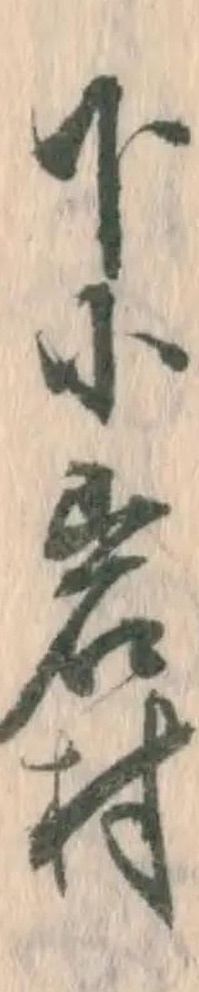下小岩村
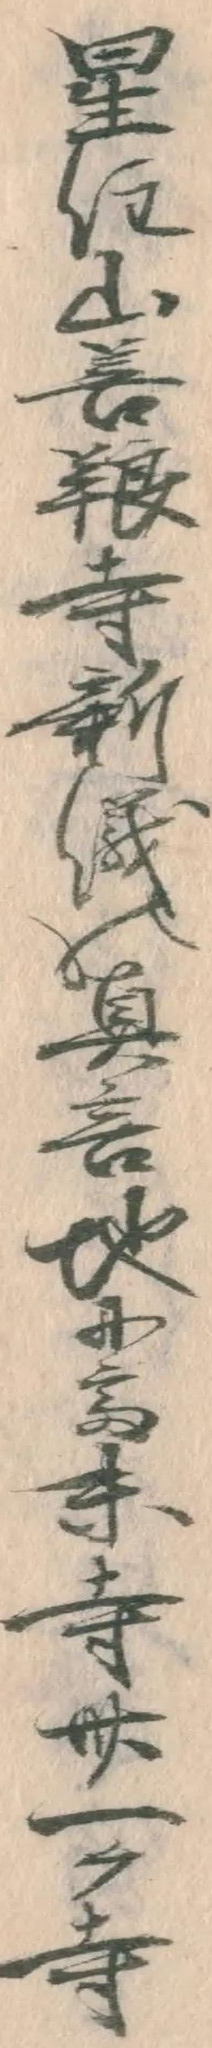星住山善養寺新儀の真言地にて末寺卅一ヶ寺
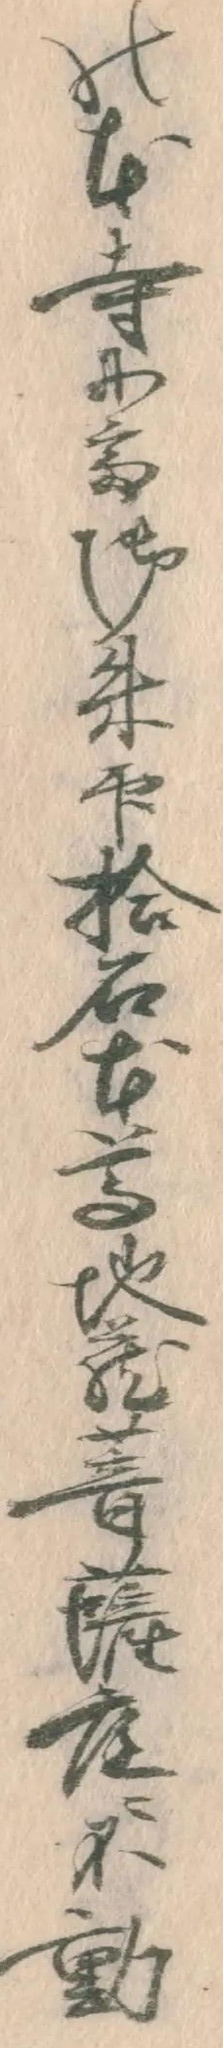の本寺にて御朱印拾石本尊地蔵菩薩庭に不動
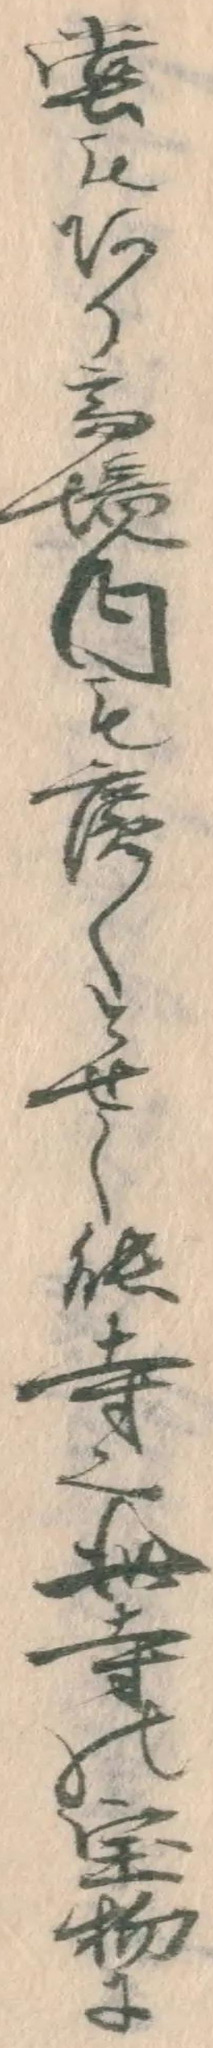堂もありて境内も広〳〵とせし能寺也此寺の宝物に
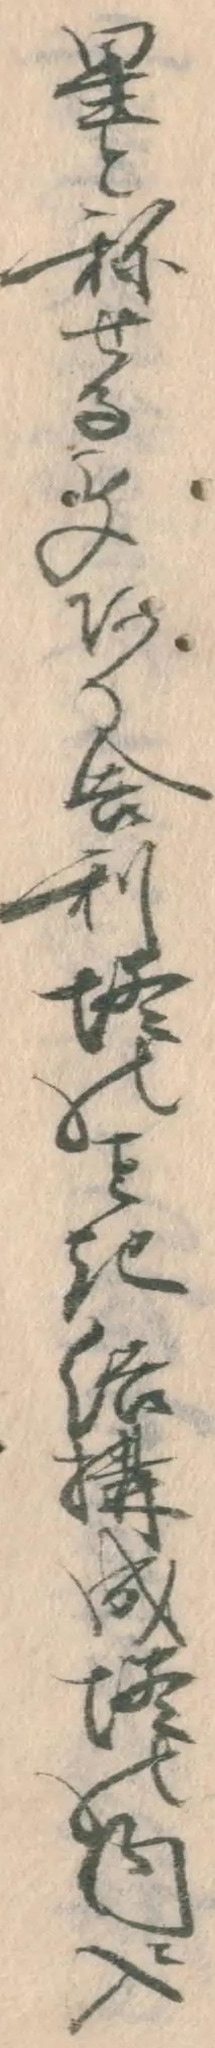星と称せるものあり舎利塔のことき塔構成塔の内に入
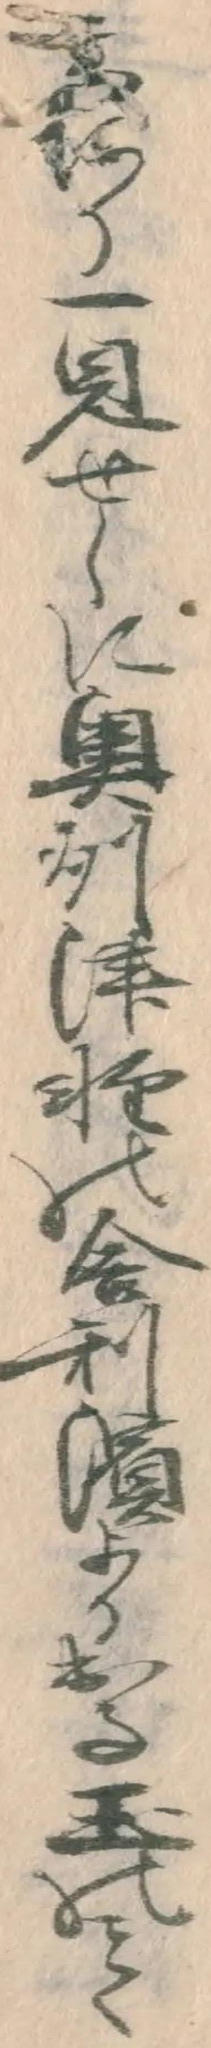てあり一見せしに奥州津軽の舎利浜より出る玉のことく

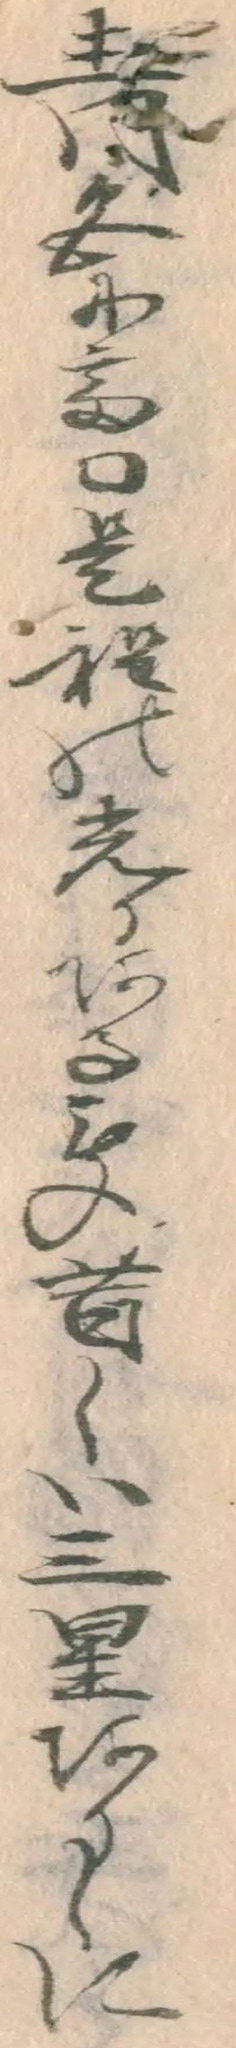青色にて是程の光りあるもの昔しは三星ありしに
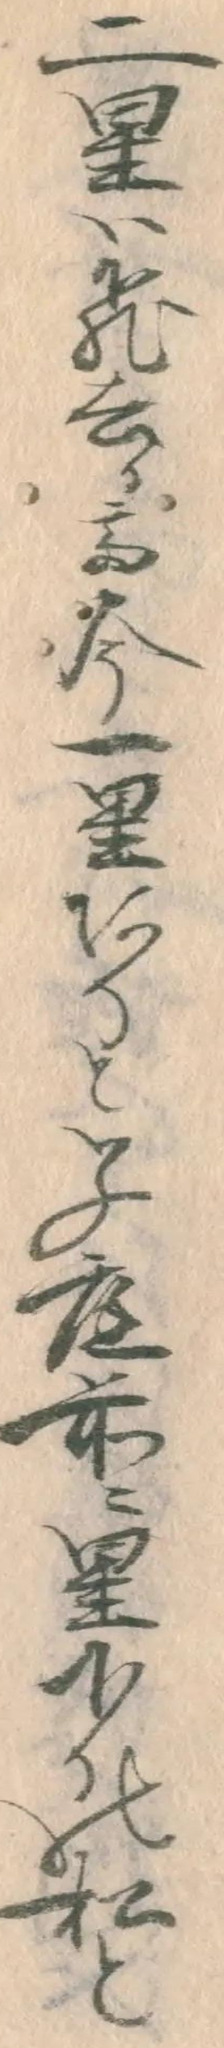二星は飛去りて今一星ありといふ庭前に星下りの松と
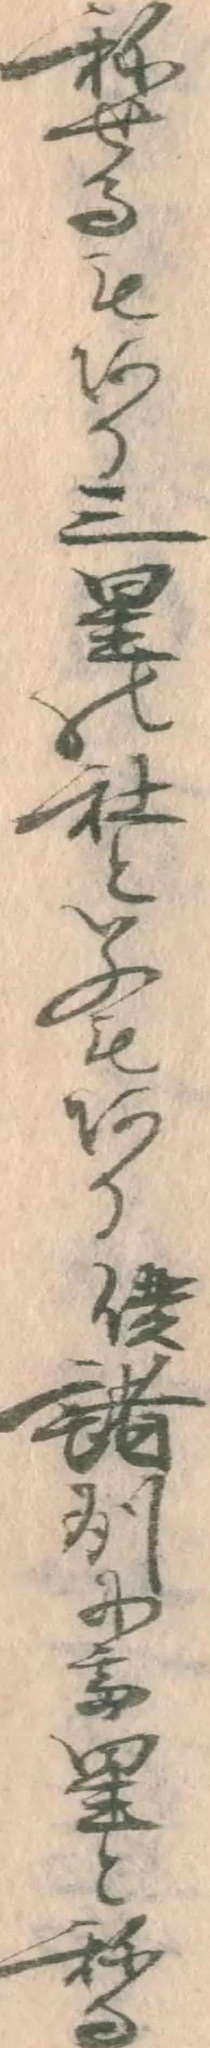称せるもあり三星の社といふもあり僕諸州にて星と称る
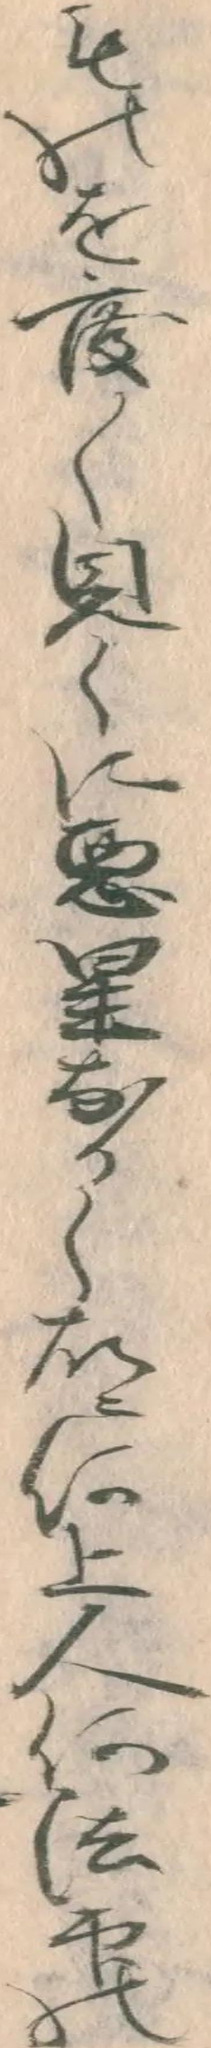ものを度〳〵見しに悪罪なかく故に何上人何法印の
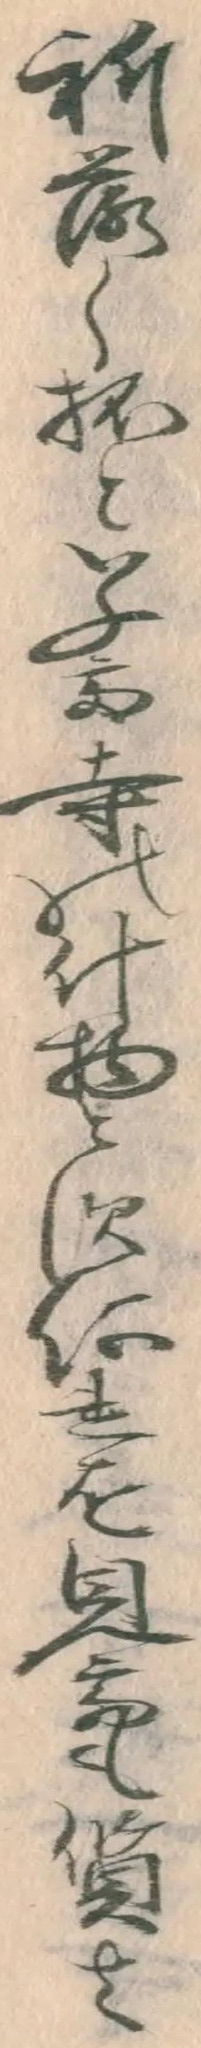祈落し抔といふて寺の什物とす何れを見ても質は
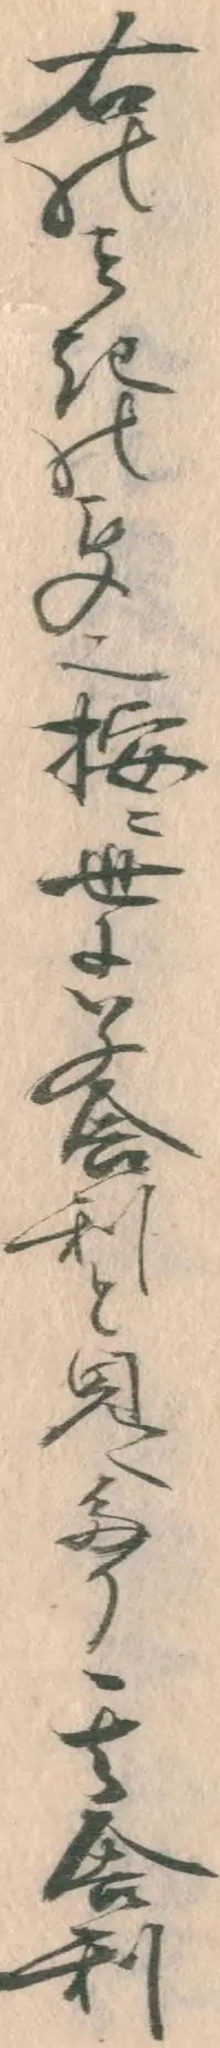右のこときのもの也按に世にいふ舎利と見へたり其舎利
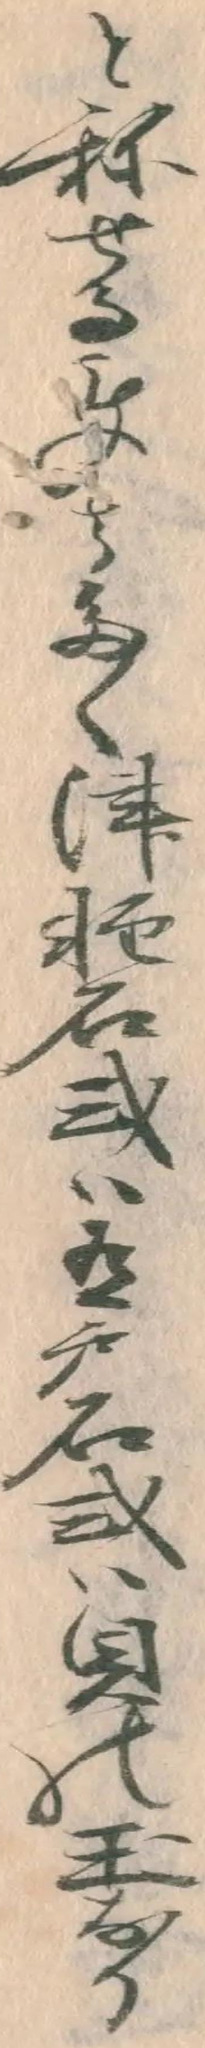と称せるものは多く津軽石或は有戸石或は貝の玉なり
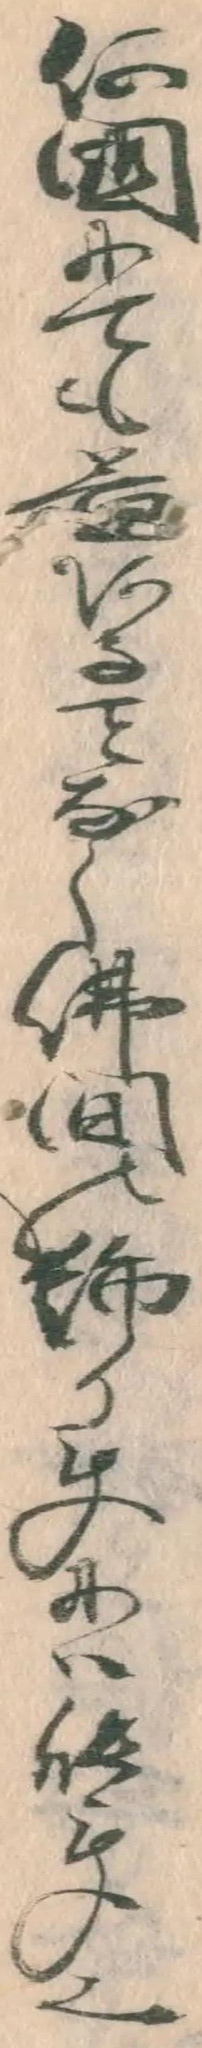何国にても益あることなく仏間の飾りものには能もの也
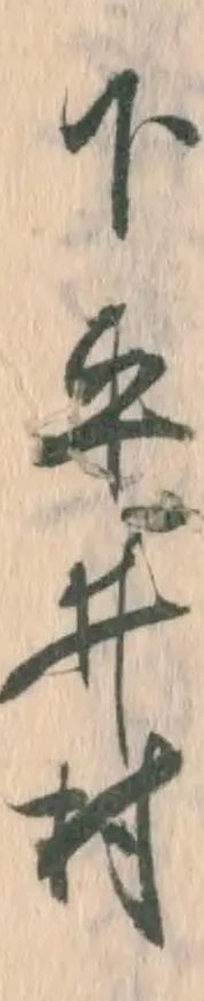下平井村
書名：四神地名録 6巻. [4]葛飾郡
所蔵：国立国会図書館 National Diet Library, JAPAN
